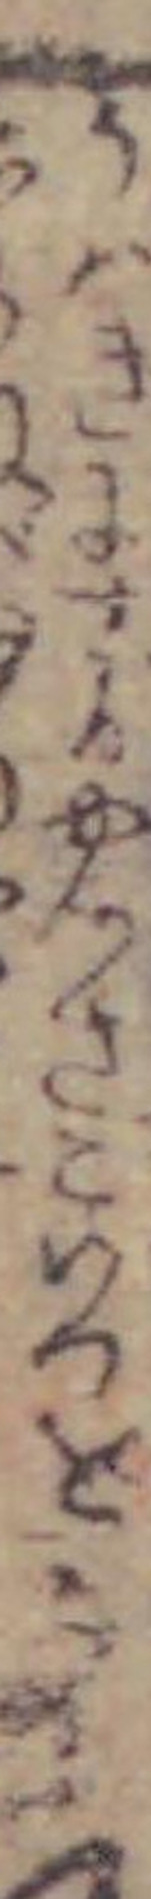うはきにするやつさこいつを
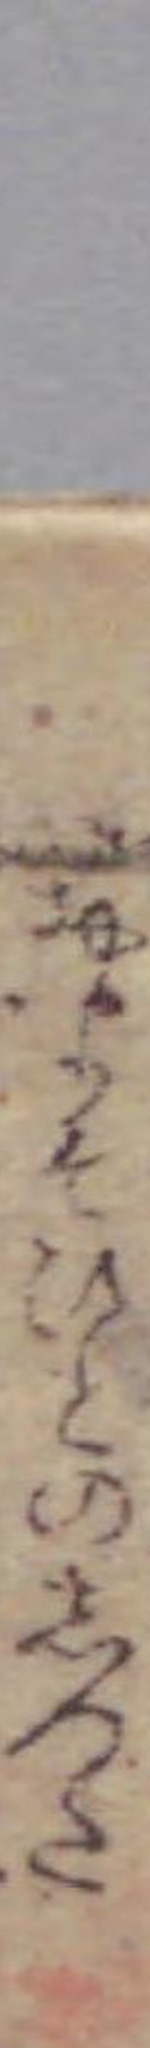およそひとのしつた
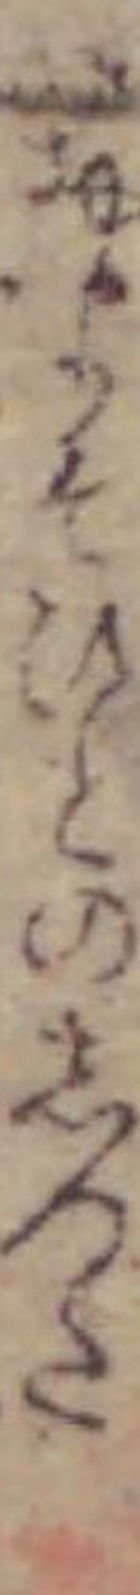およそひとのしつた
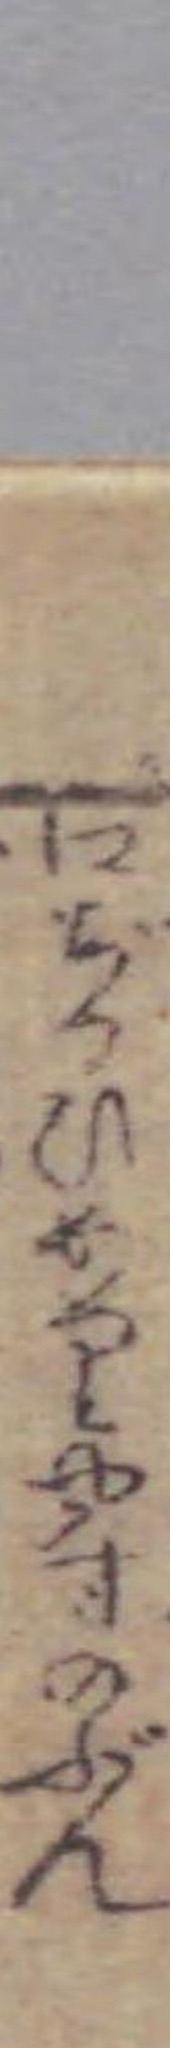口ぢかひめりやすのぶん
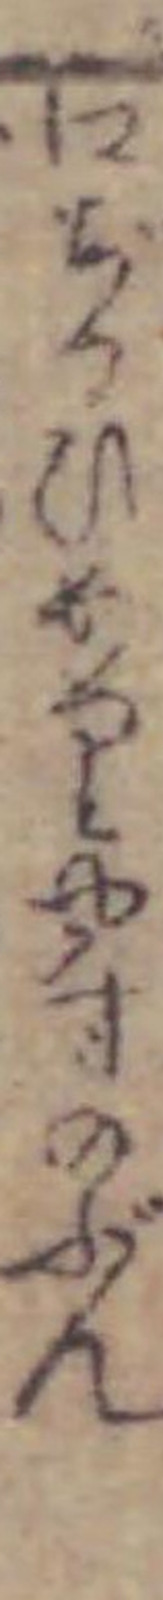口ぢかひめりやすのぶん
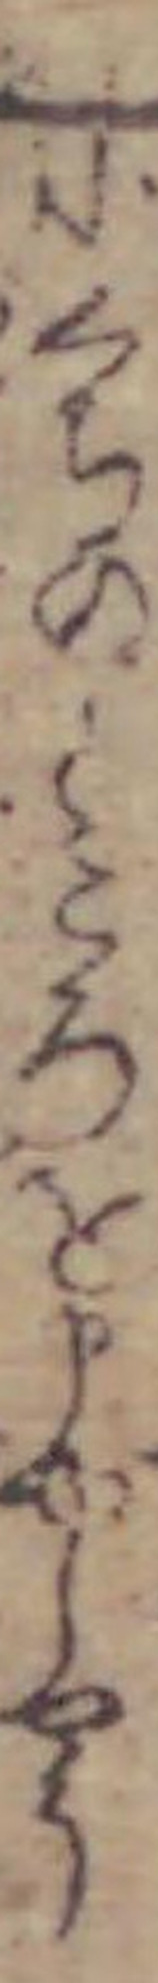小くちのところを申やしやう
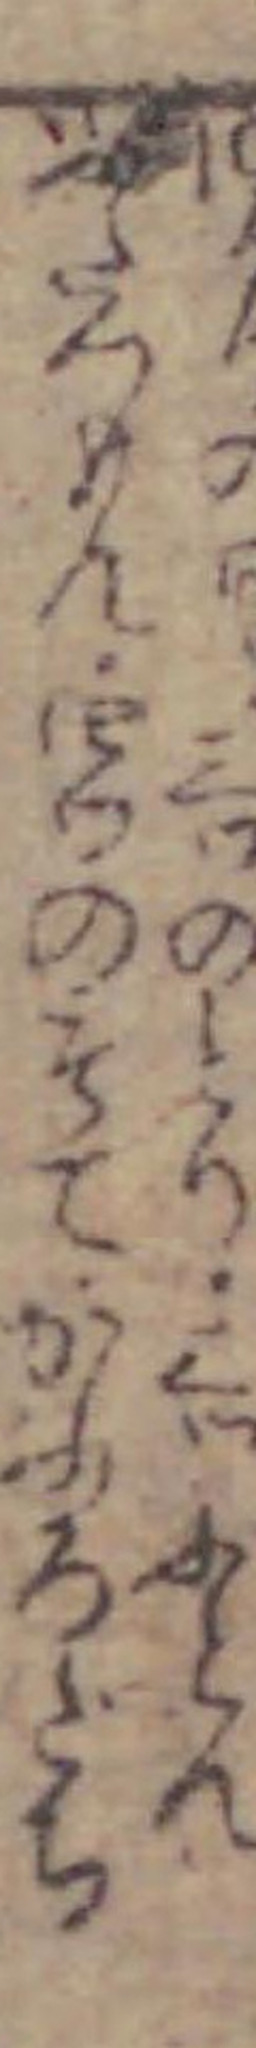ふたつもん、四つのそて、かふろだち
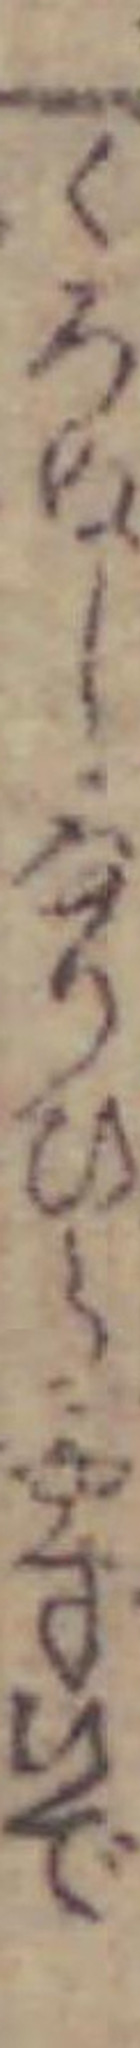くろぬし、なりひらにやすひで
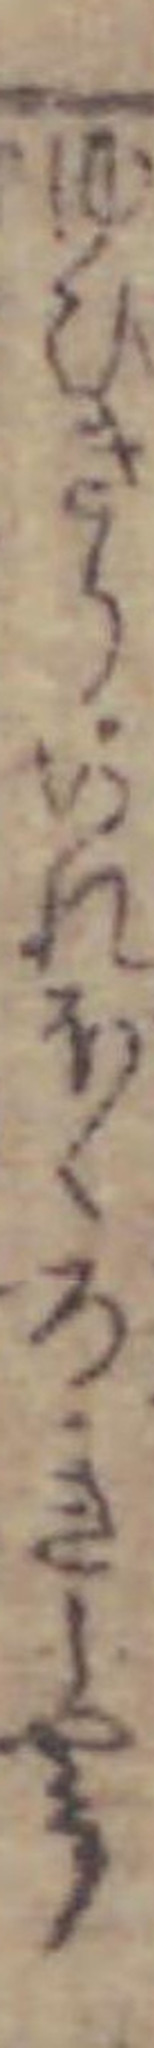ゆびきり、いれぼくろ、きしやう
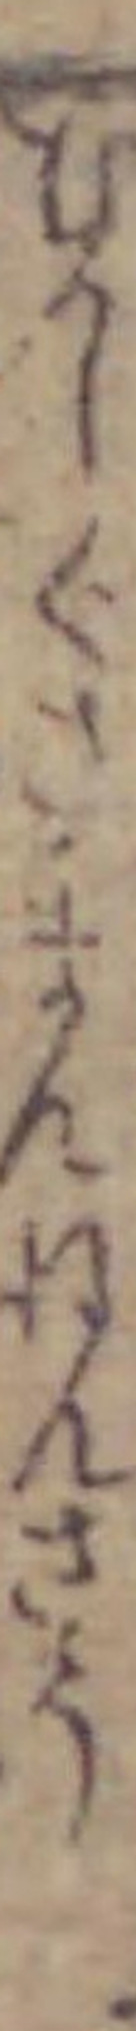むかしぐさ、まんねんさう
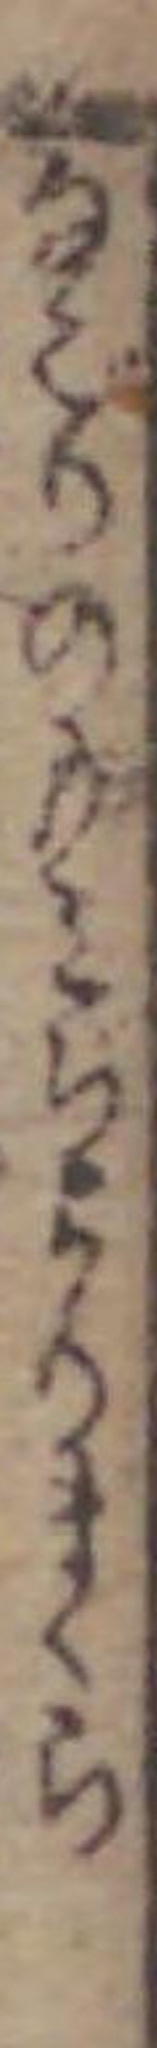なごりのもみぢ、かりまくら
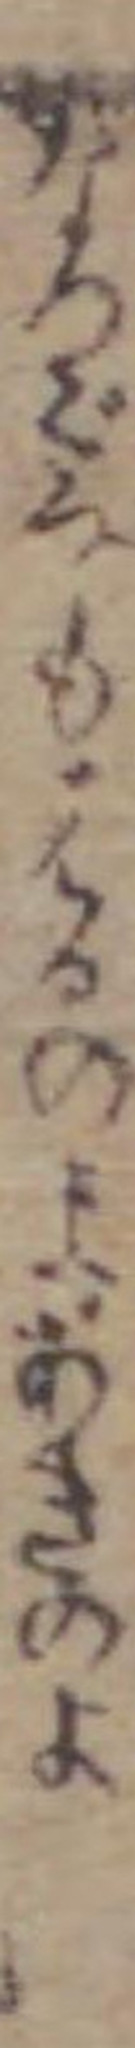なつごろも、はるのよ、あきのよ
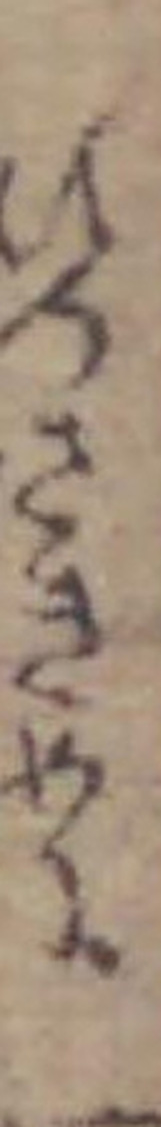ひつさきめに
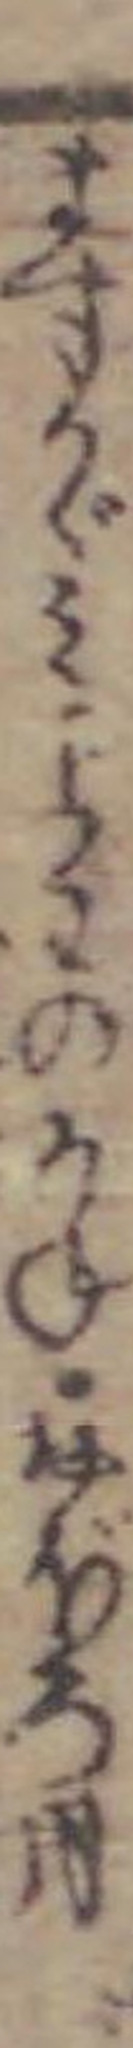ますかゞみ、よわのかね、おぼろ月
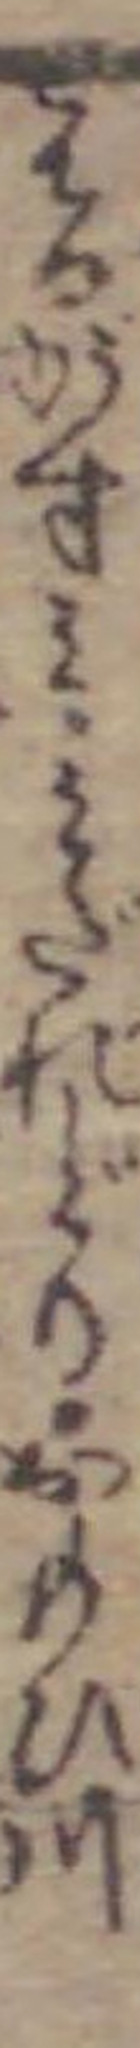はるがすみ、みだれどり、おもひ川
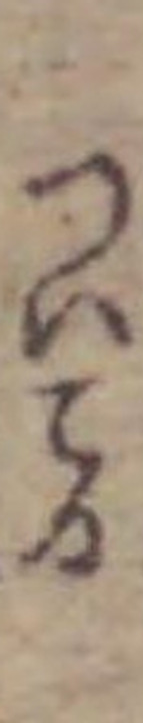ついてる
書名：江戸生艶気樺焼 : 3巻
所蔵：国立国会図書館 National Diet Library, JAPAN
